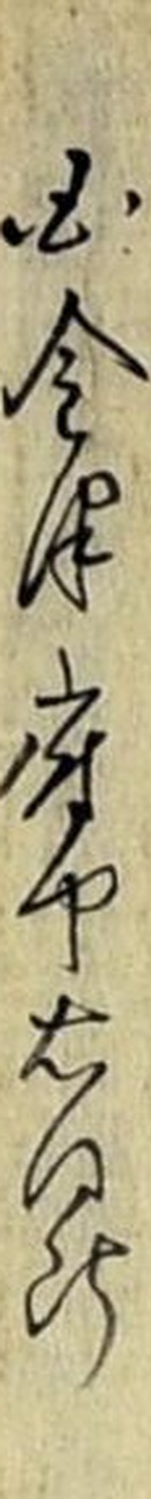国金津府中右同断
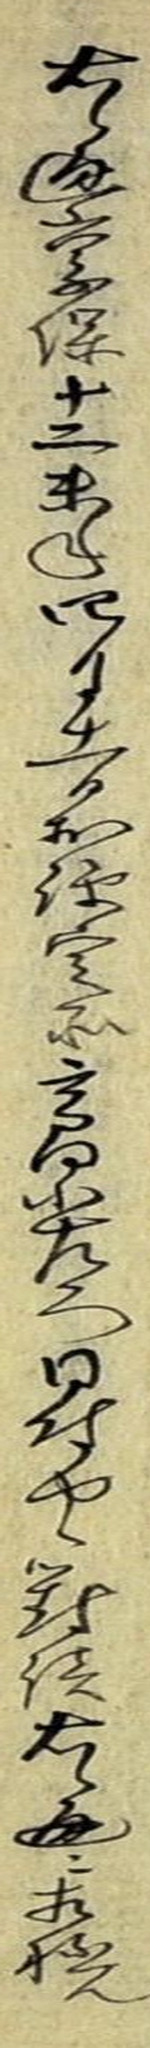右之通享保十二未年四月十一日於評定所高田小左衛門目付中へ対談右之通ニ相極ル
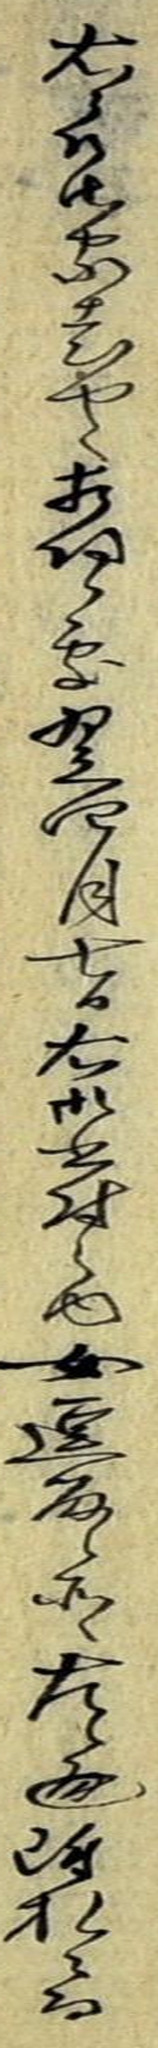右ニ付御家老中へ相伺候処翌四月七日右御書付之内女逗留之所へ左之通付札ニ而
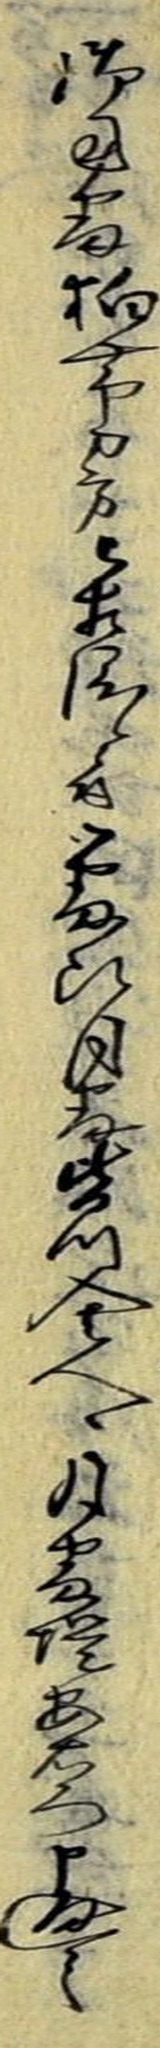御用番狛帯刀方被相渡候ニ付御番頭月番皆川舎人へ月番堤安右衛門申通之

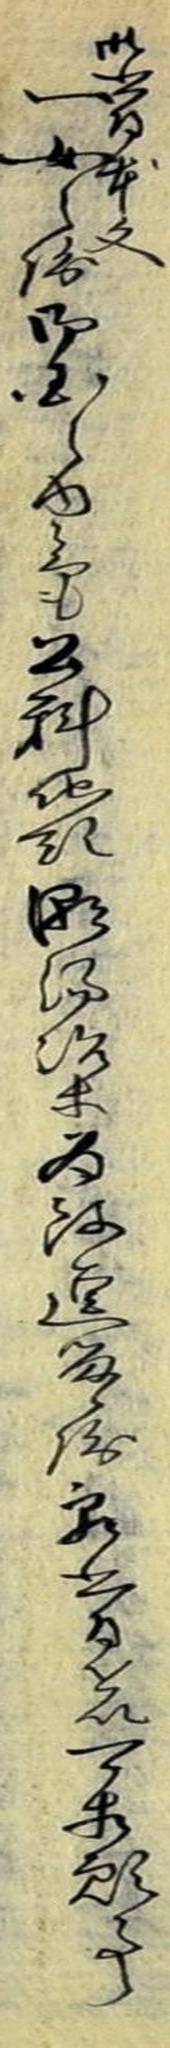一女之儀御国之内ニ而も公料他領潮湯治等為致逗留候儀願書付を以可相願事
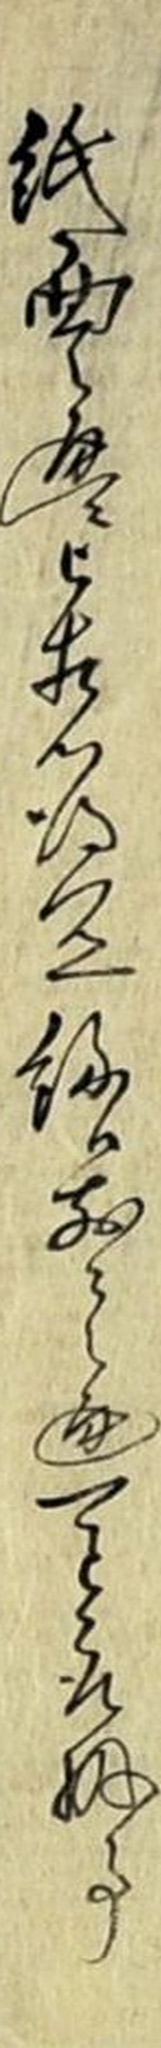紙面之通ニ被相心得宜余ハ前々之通可被取扱事
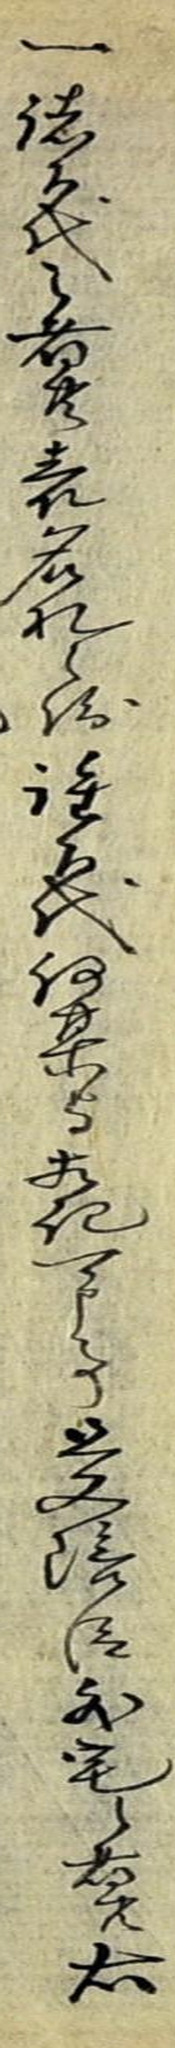一諸下代之者共表名札之儀誰下代何某世与相記可申事且又陪臣外宅之者共右
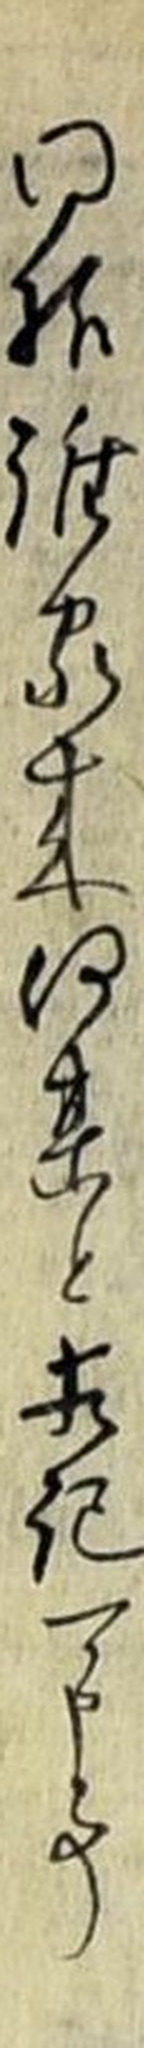同様誰家来何某と相記可申事
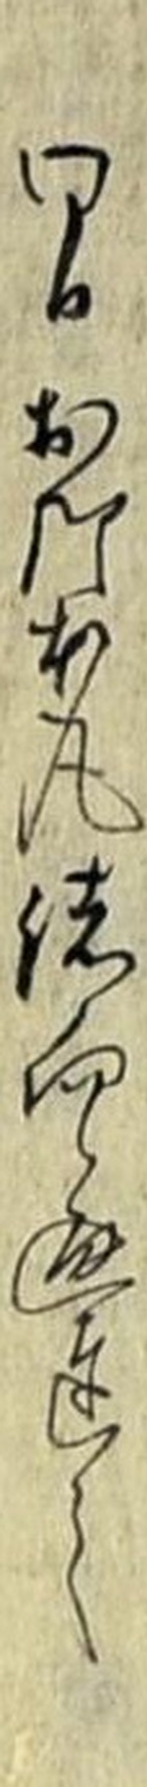同日於御本丸諸向へ通達之
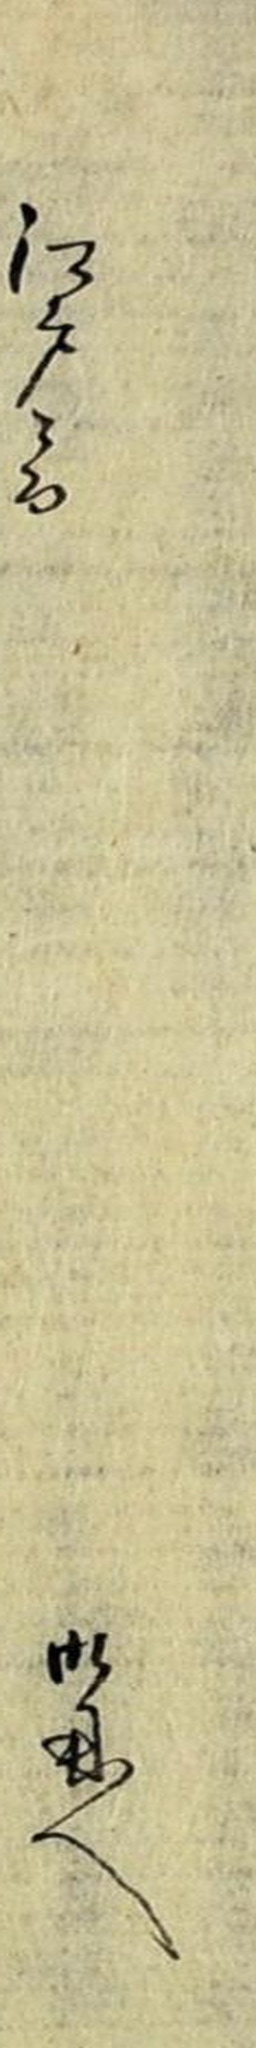江戸ニ而御用人
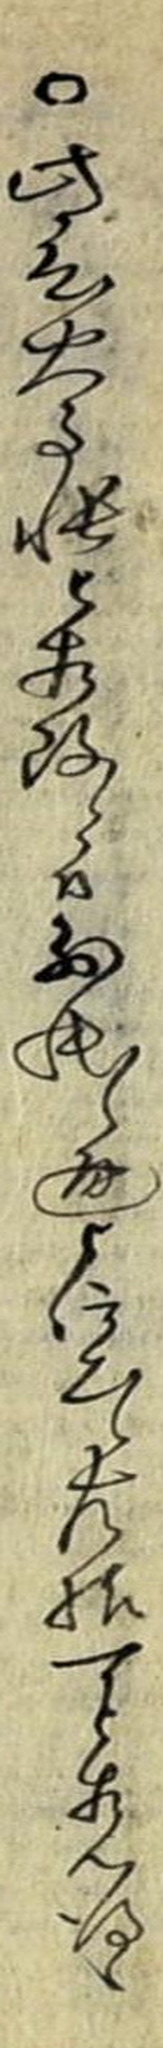〇此度火事帳被相改候ニ付別紙之通被仰出候左様可被相心得候
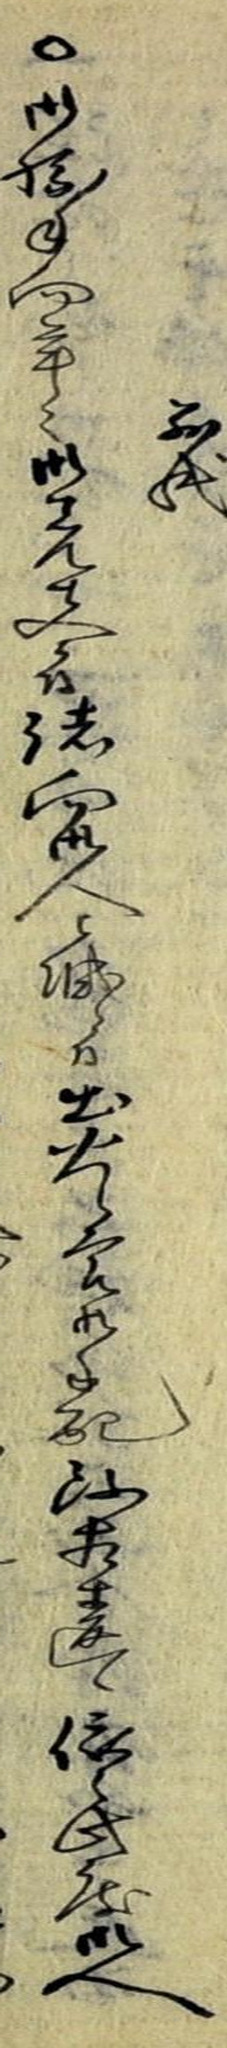〇御勝手向年々差支ニ付諸向御人被減候ニ付出火之節御手配致相違候依之此度御人
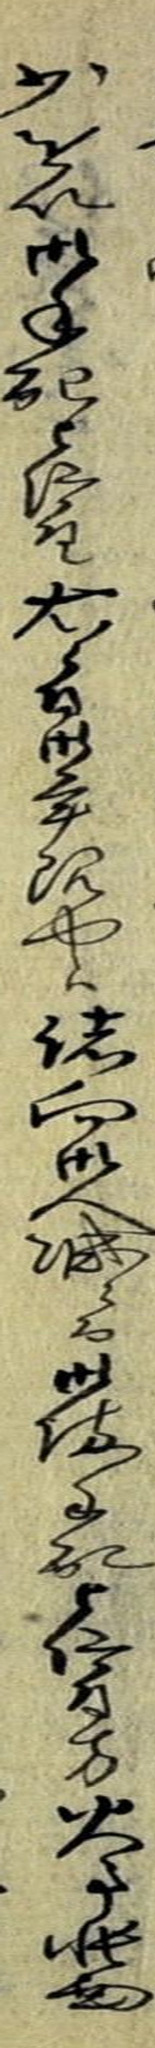少を以御手配被仰付候右ニ付御年限中ハ諸向御人減ニ而御備手配被仰付方火事帳面
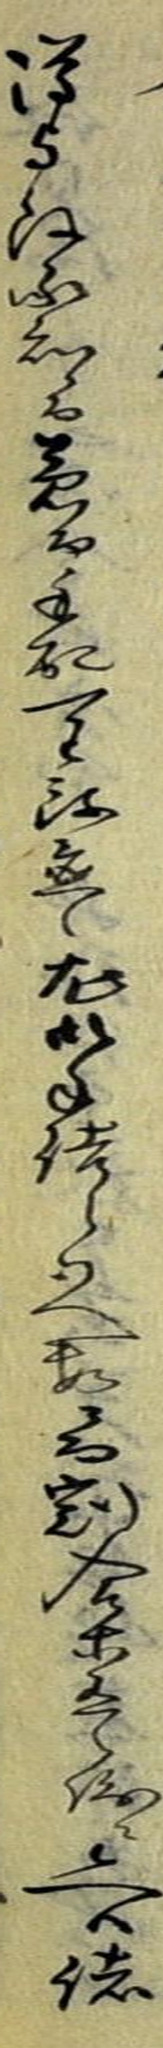得与致承知候而兼而手配可被致置候尤御手詰之御人数ニ而割合等有之儀ニ候ヘハ諸
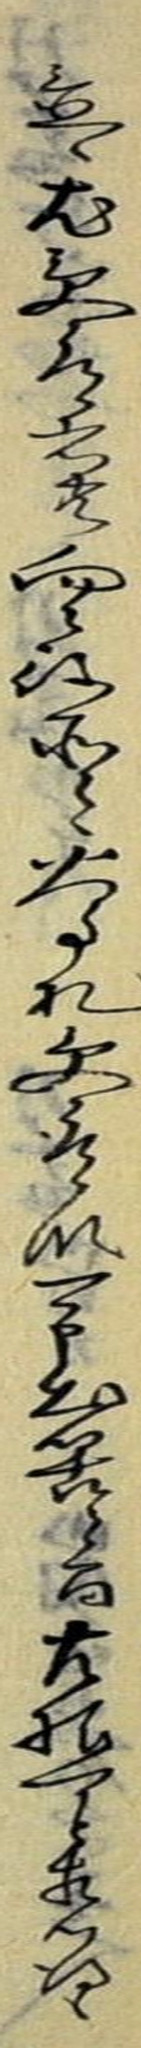置候尤受取候者共向々役所々へ火事札受取候段可申出筈ニ候間左様可被相心得候
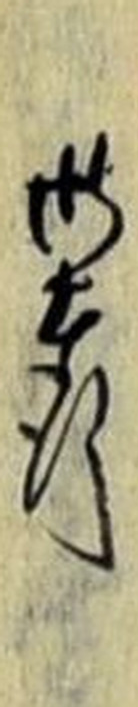御奉行
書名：命令之部 三
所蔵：福井県文書館 Fukui Prefectural Archives
